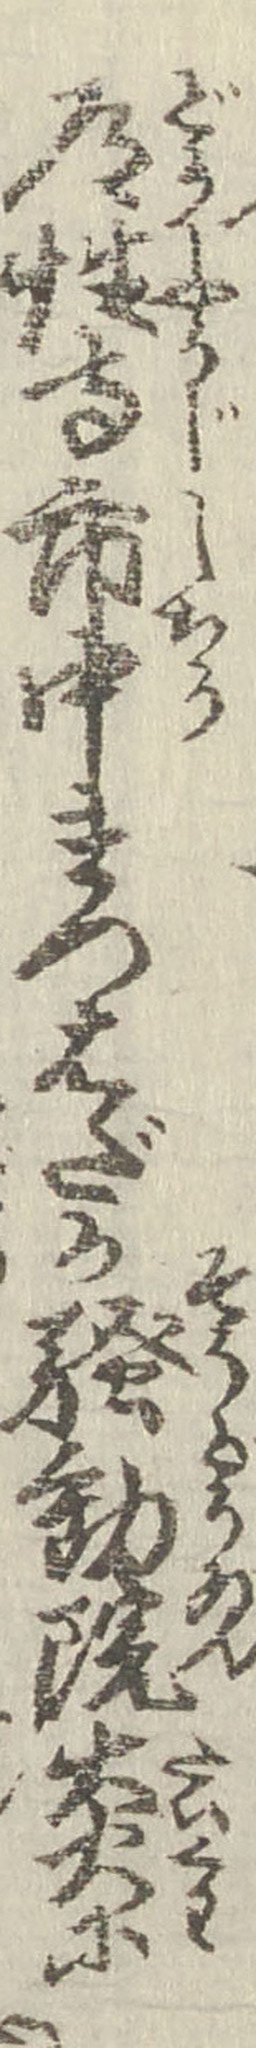道性寺市中まつはだか騒動院大火に
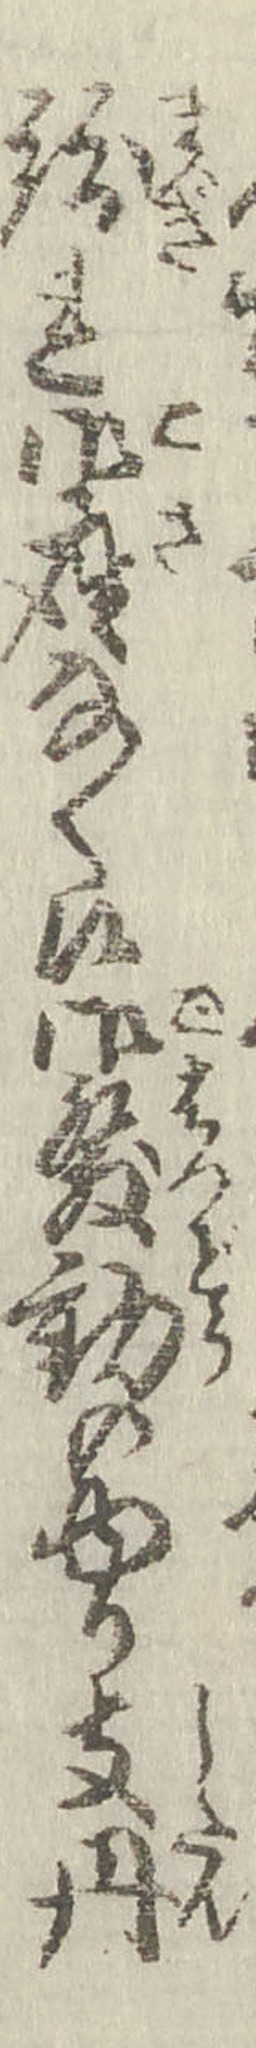紛れ御座なく候御發動のゆり支丹
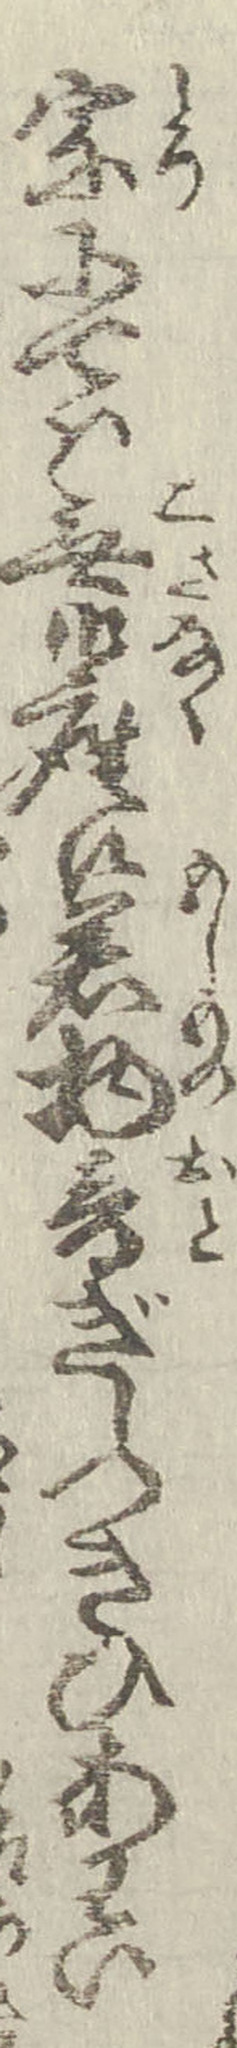宗にてハ無御座候若物音ぎしつきひあわい
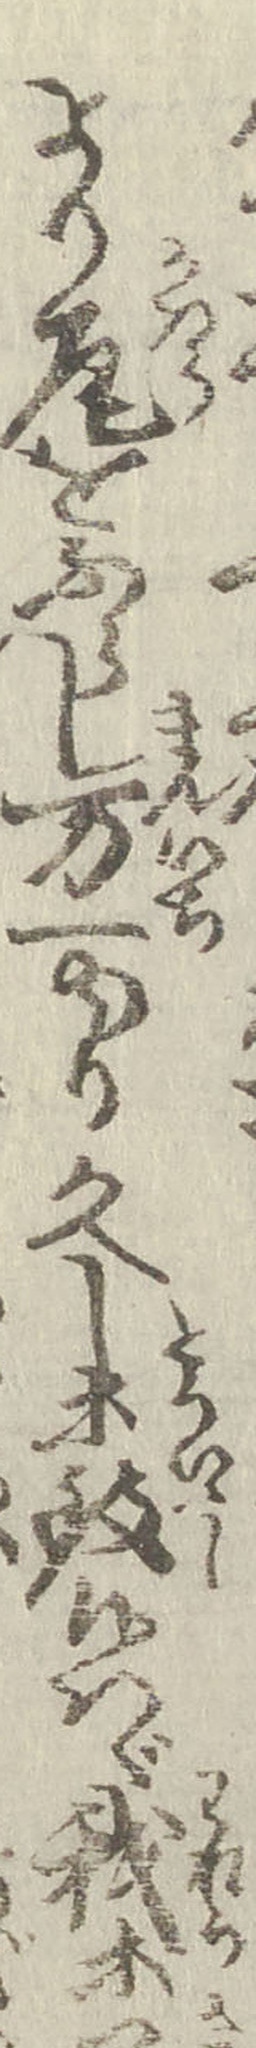より瓦をふらし万一ゆり久し等致候ハヾ我等早速
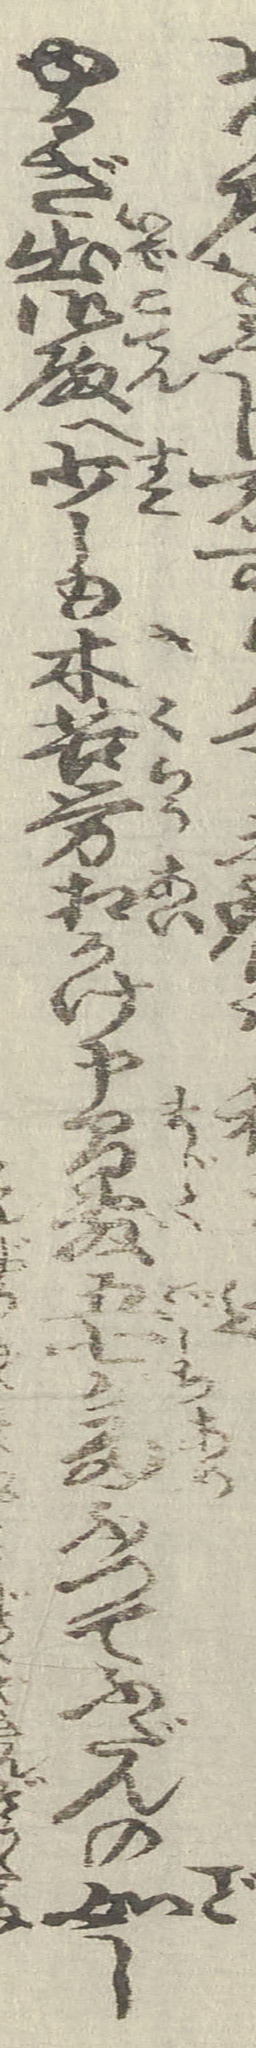ゆるぎ出御殿へ少しも木苦労相かけ申間敷五七か雨ふつてふだんの如し
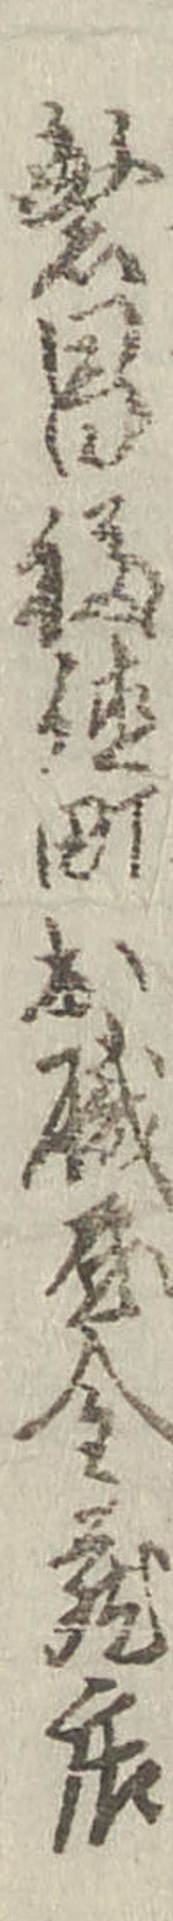繁昌福徳町出職屋金蔵店
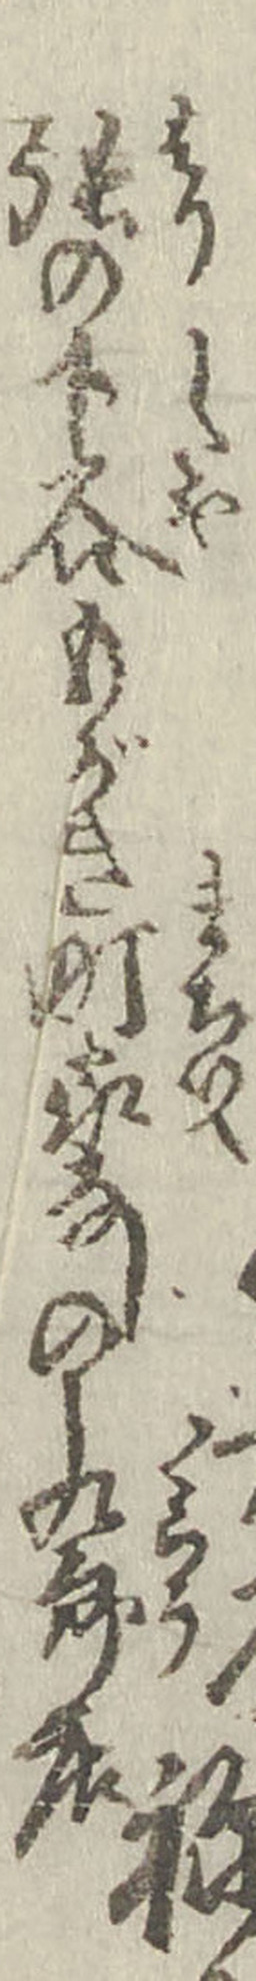張の下谷もがき町家なしの九郎店
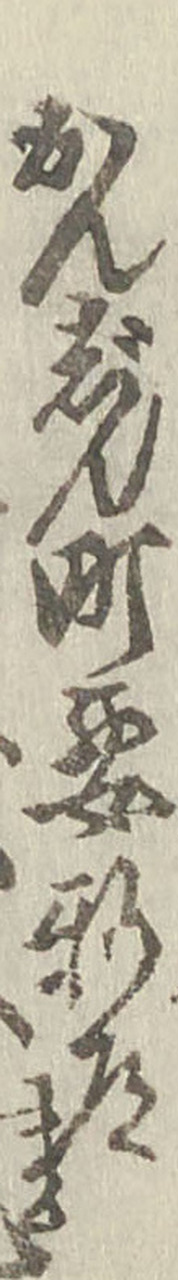かんじん町要新道
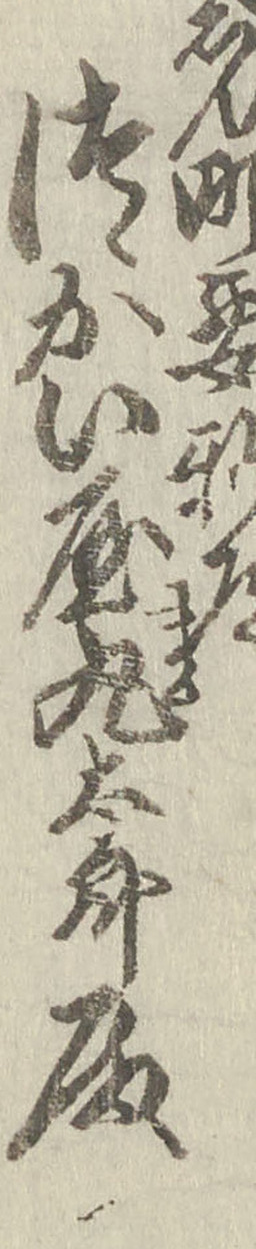つゝかい屋丸太郎殿
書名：地震方々ゆり状之事
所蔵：東京大学総合図書館 General Library in the University of Tokyo, JAPAN
